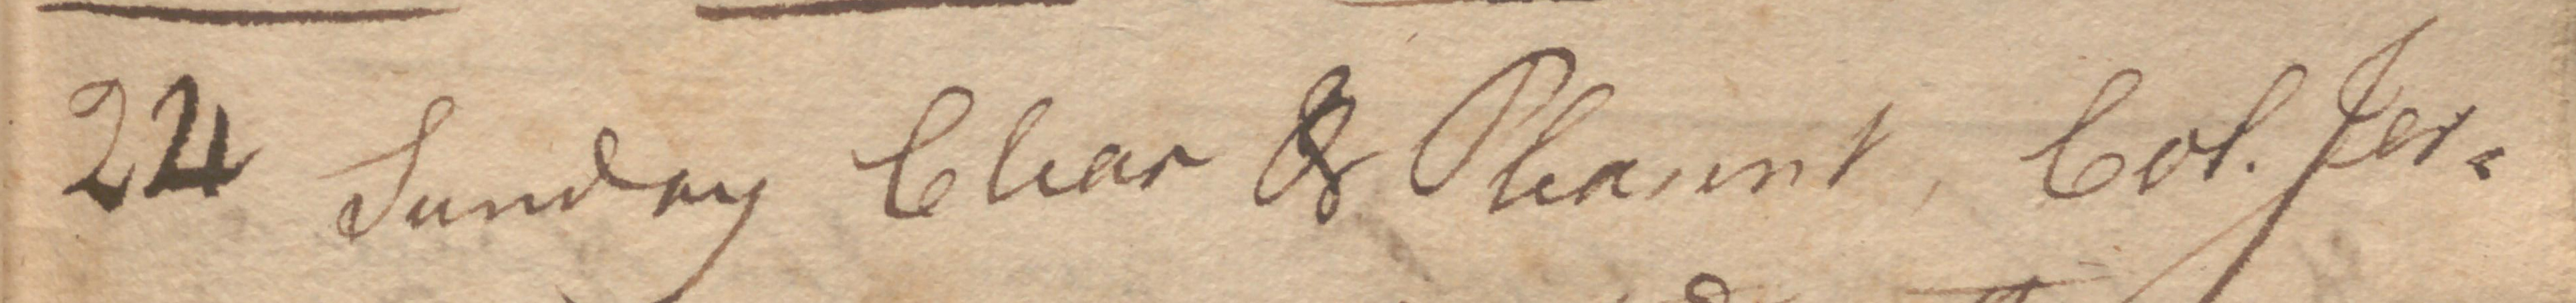24 Sunday Clear & Pleasent, Col. Jer-
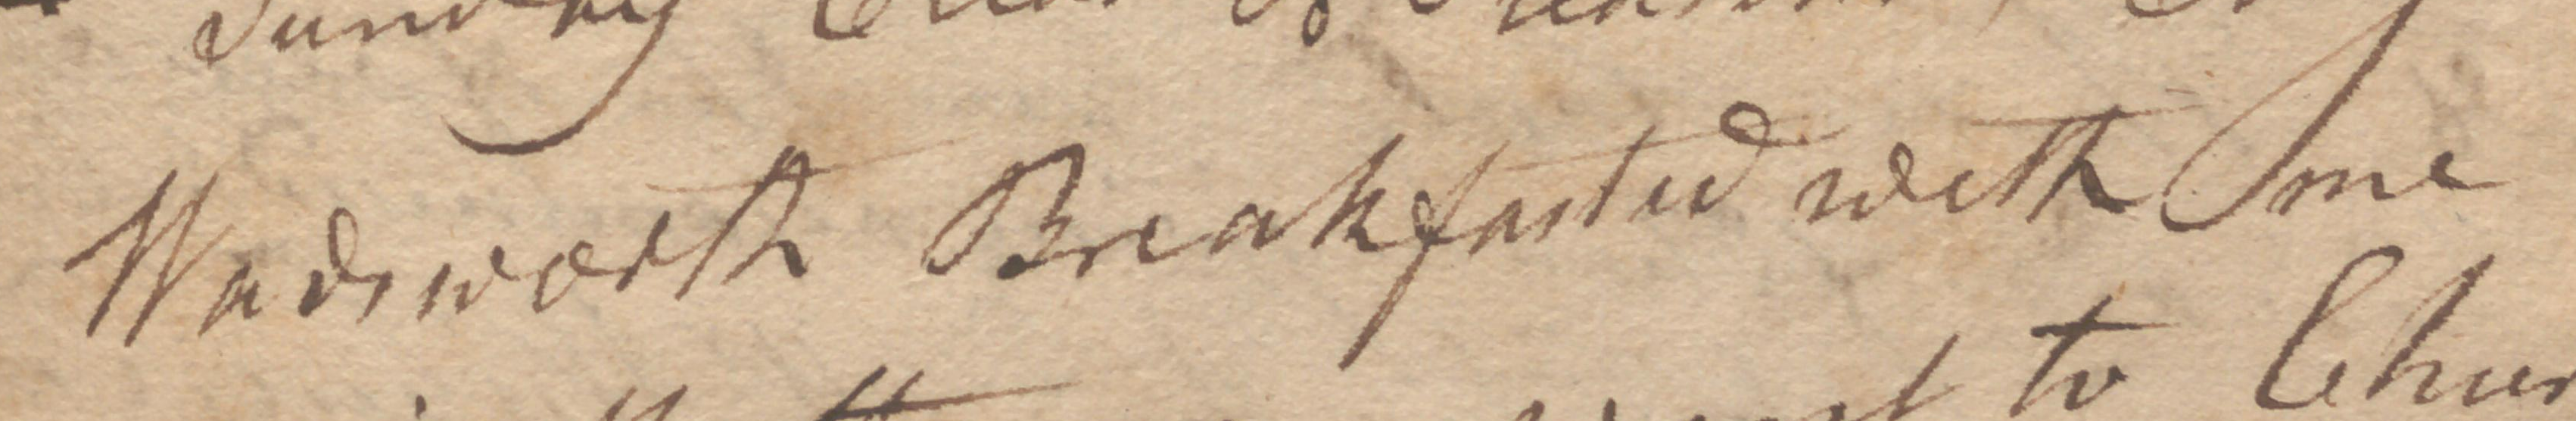Wadsworth Breakfasted with me
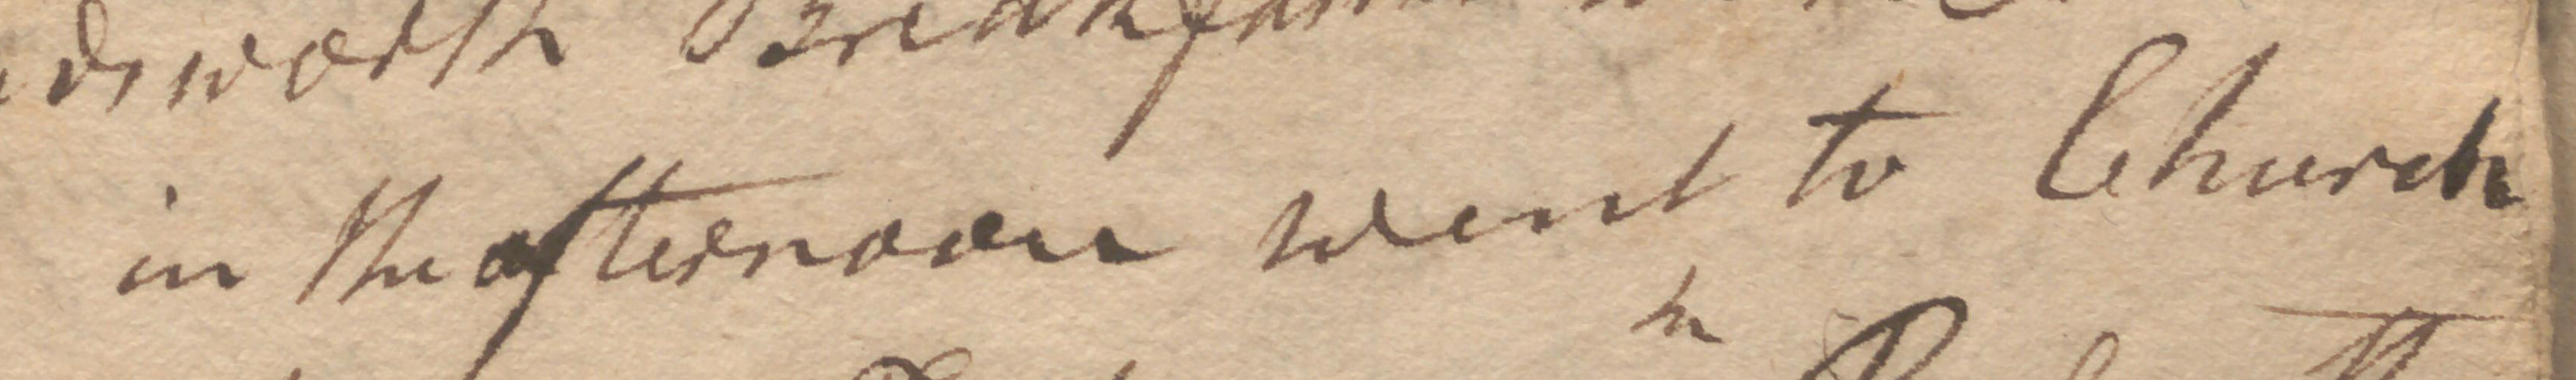in the afternoon went to Church
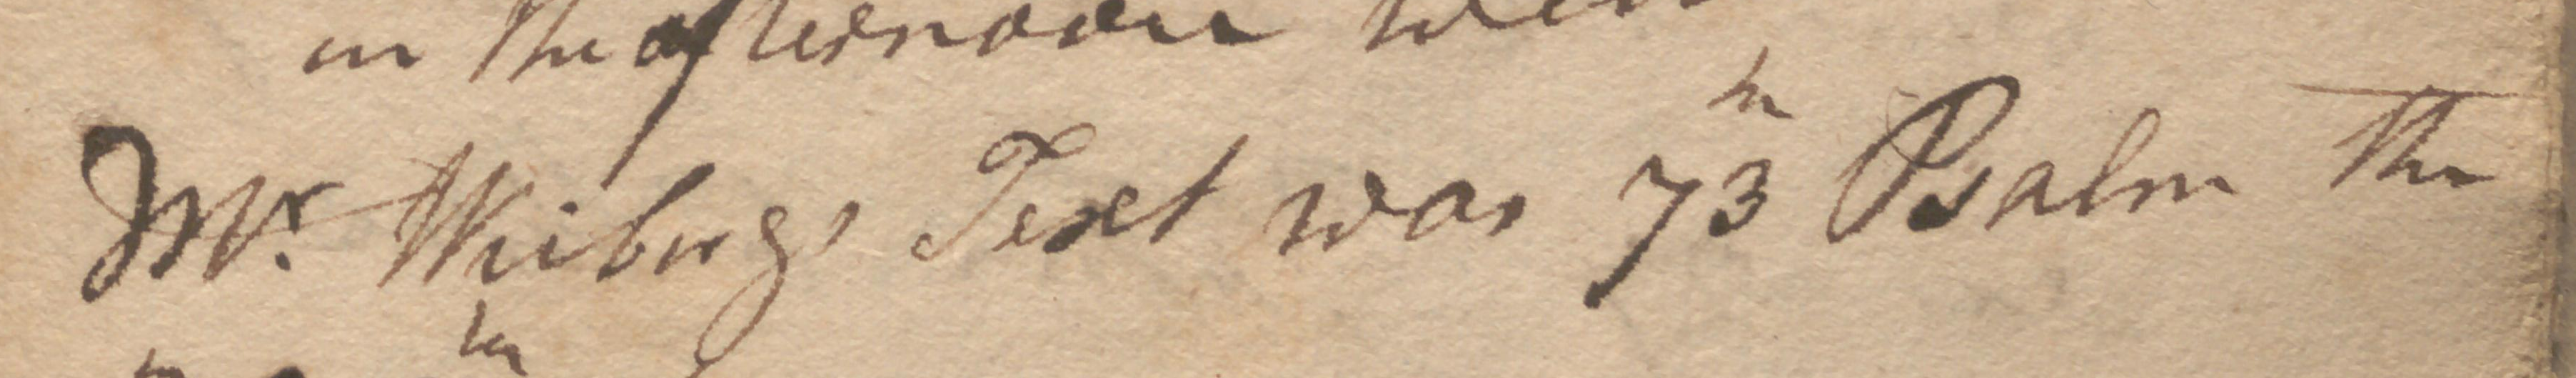M^r. Weibergs Text was 73^th Psalm the
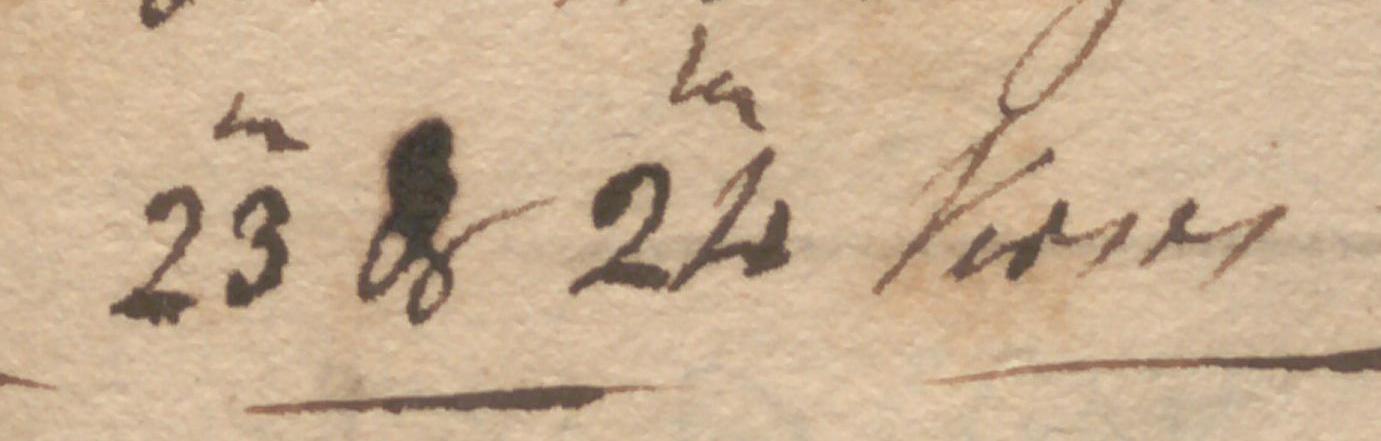23^th & 24^th Verses
